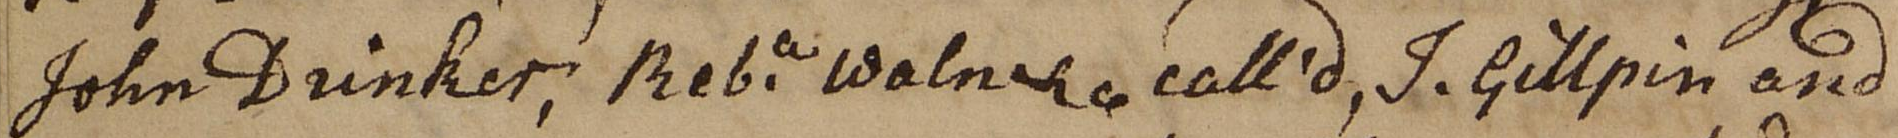John Drinker; Reb^a. Waln &c call'd, I. Gillpin and
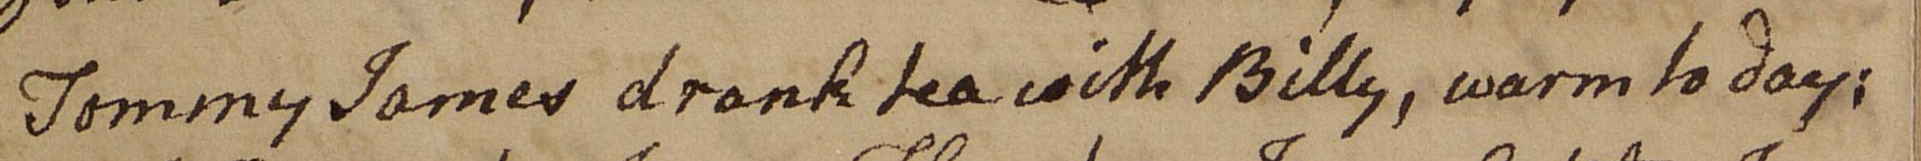Tommy James drank tea with Billy, warm to day;
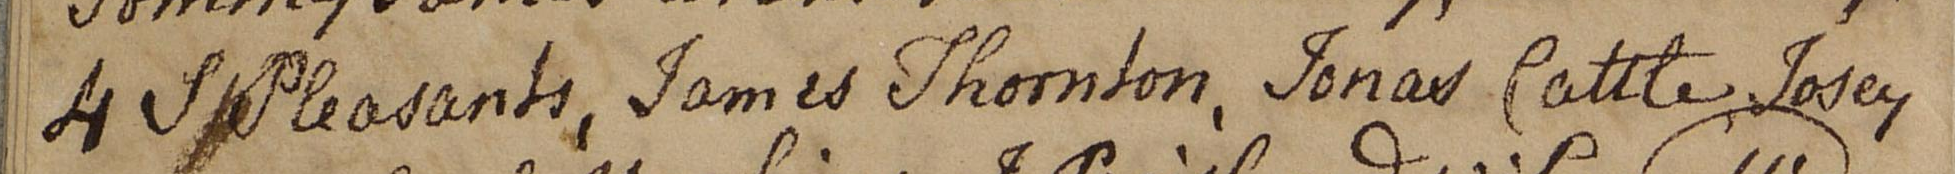4 S Pleasants, James Thornton, Jonas Cattle, Josey
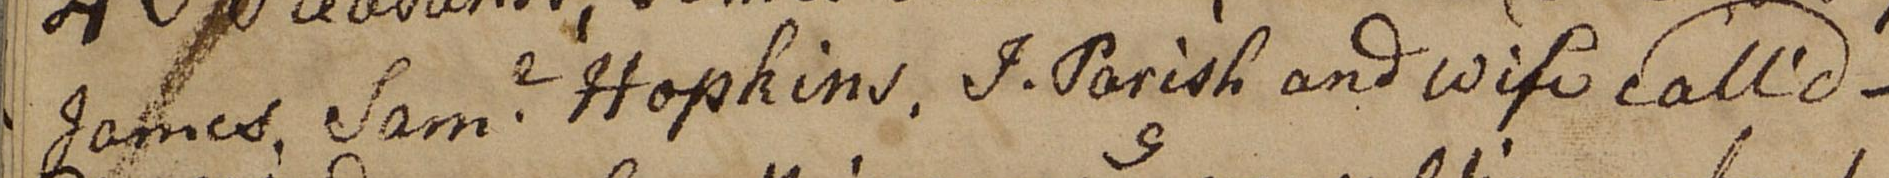James, Sam^l. Hopkins, I. Parish and Wife call'd-
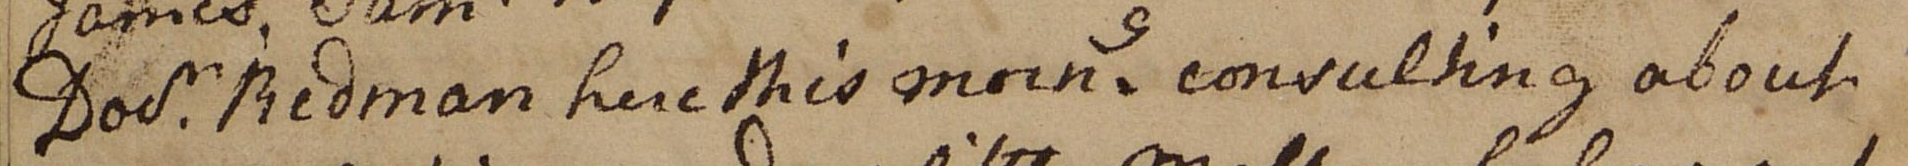Doc^r. Redman here this morn^g. consulting about
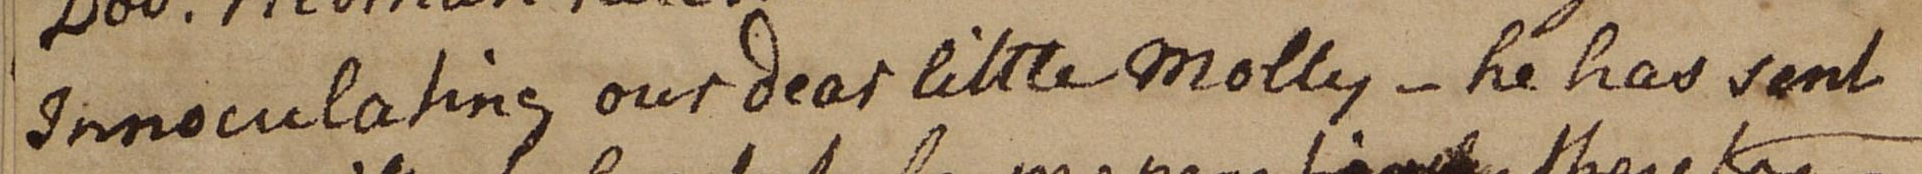Innoculating our dear little Molly- he has sent
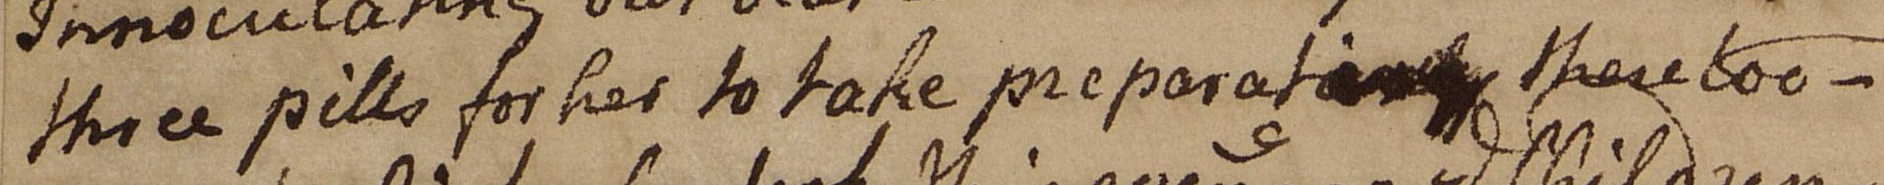three pills for her to take preparations these too-
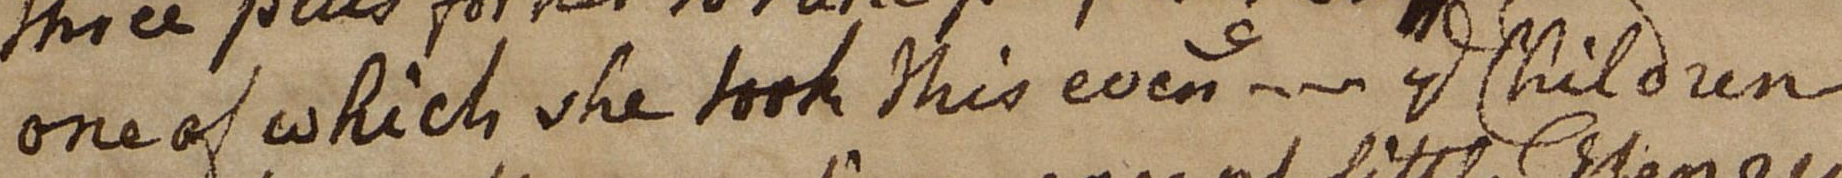one of which she took this even^g-- y^e Children
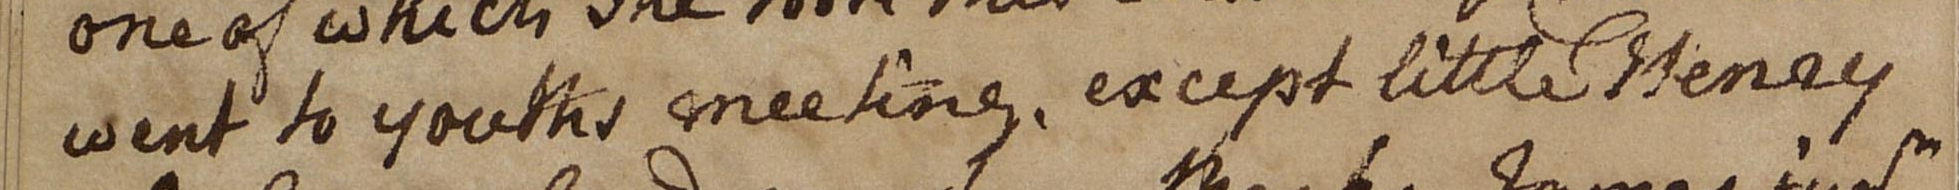went to youths meeting, except little Henry
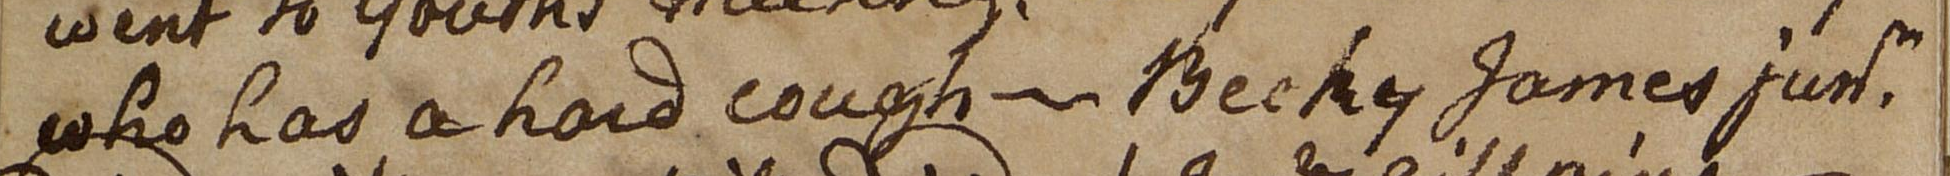who has a hard cough- Becky James jun^r.
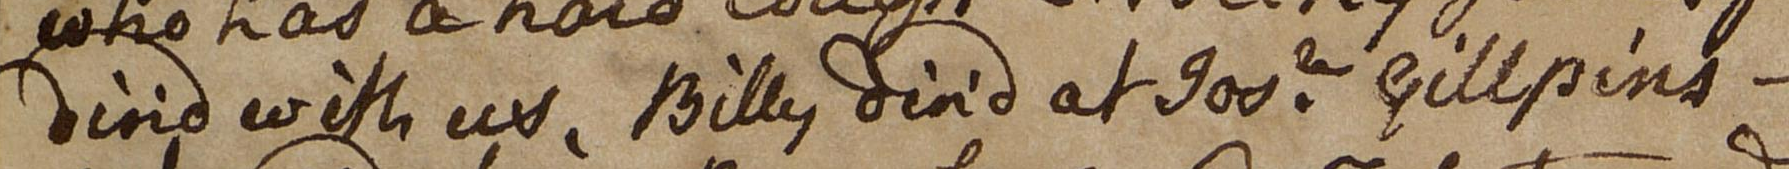din'd with us, Billy din'd at Jos^h. Gillpins-
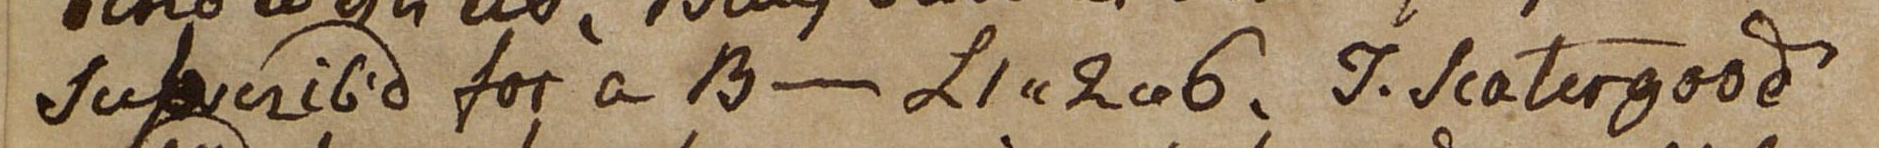supserib'd for a B- L1..2.6. T. Scatergood
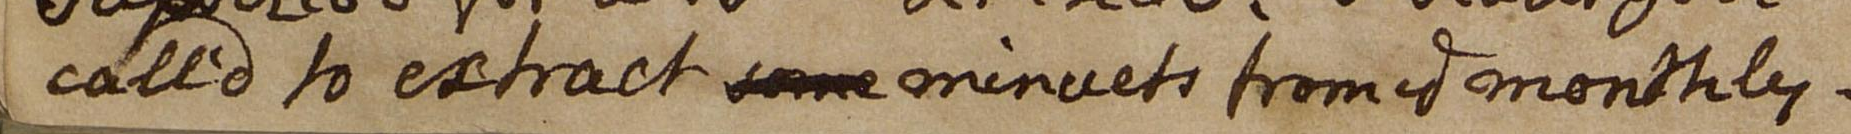call'd to extract [some] minuets from y^e monthly -
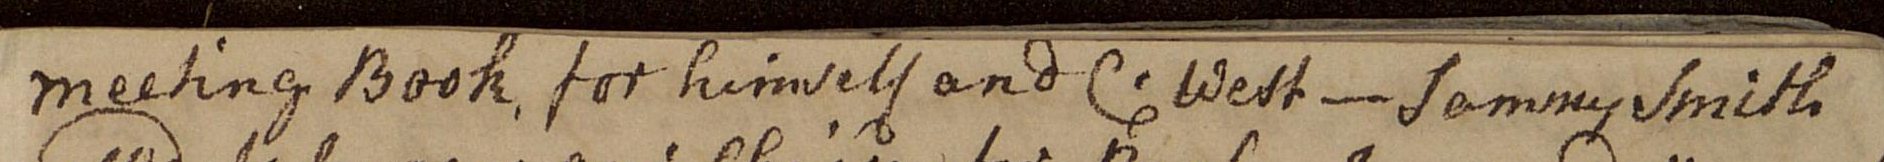meeting Book for himself and C. West- Sammy Smith
